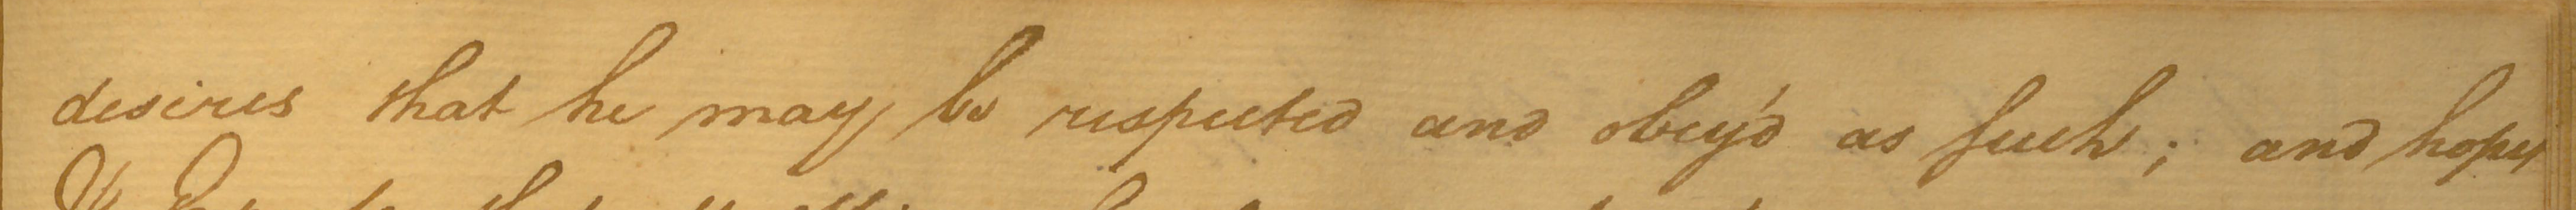desires that he may be respected and obey'd as such; and hopes
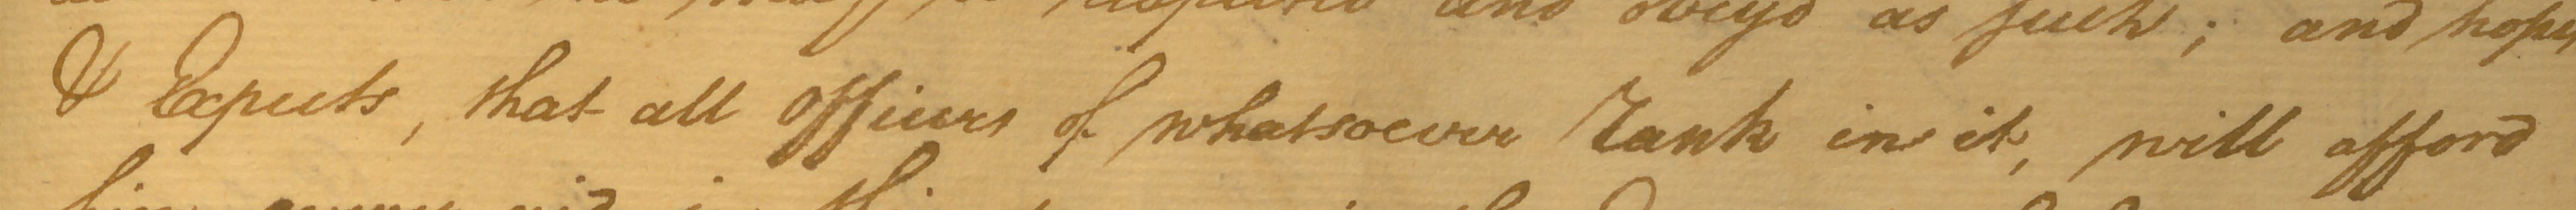& Expects, that all officers of whatsoever rank in it, will afford
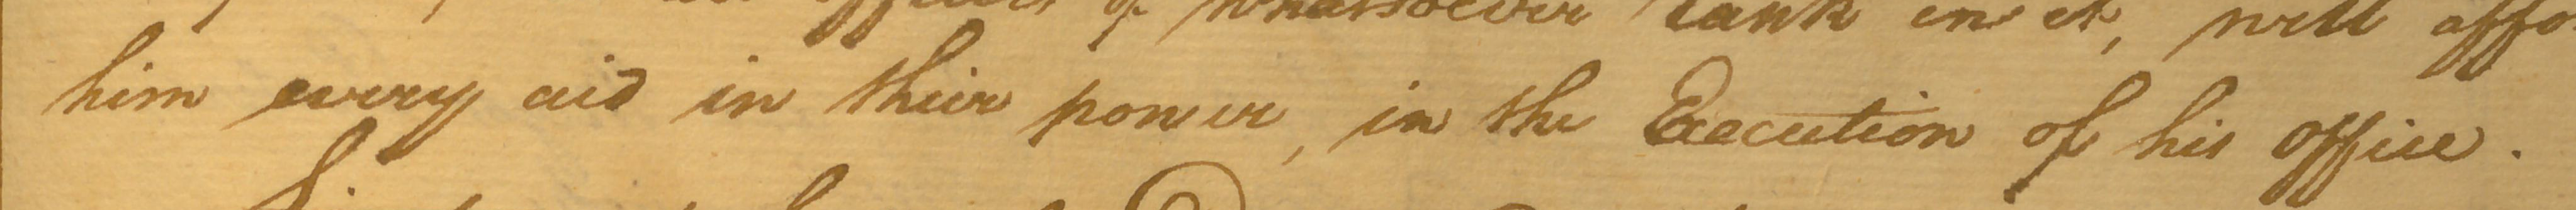him every aid in their power, in the Execution of his office.
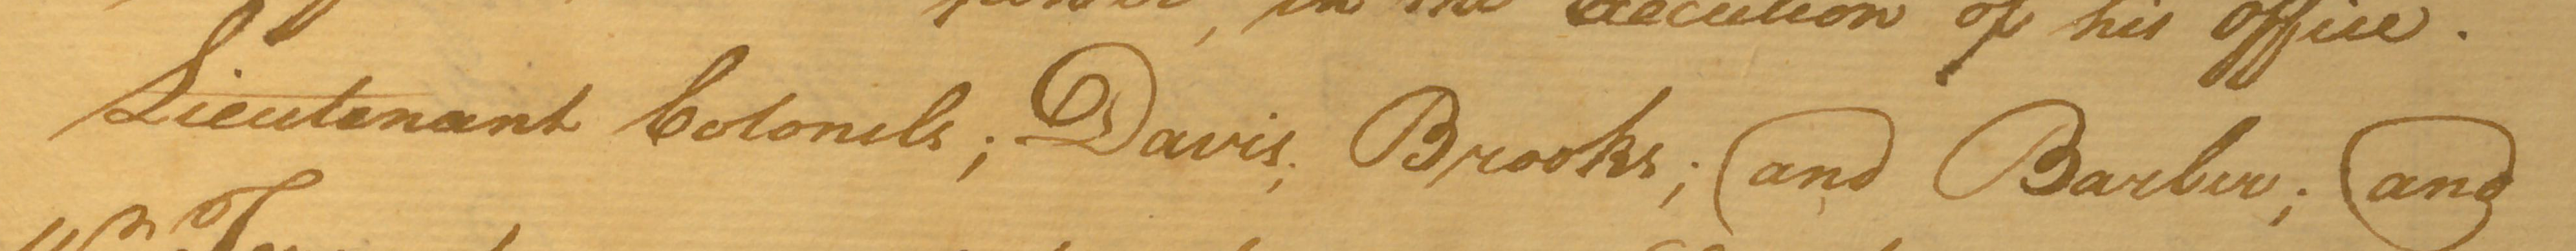Lieutenant Colonols; Davis; Brooks; and Barber; and
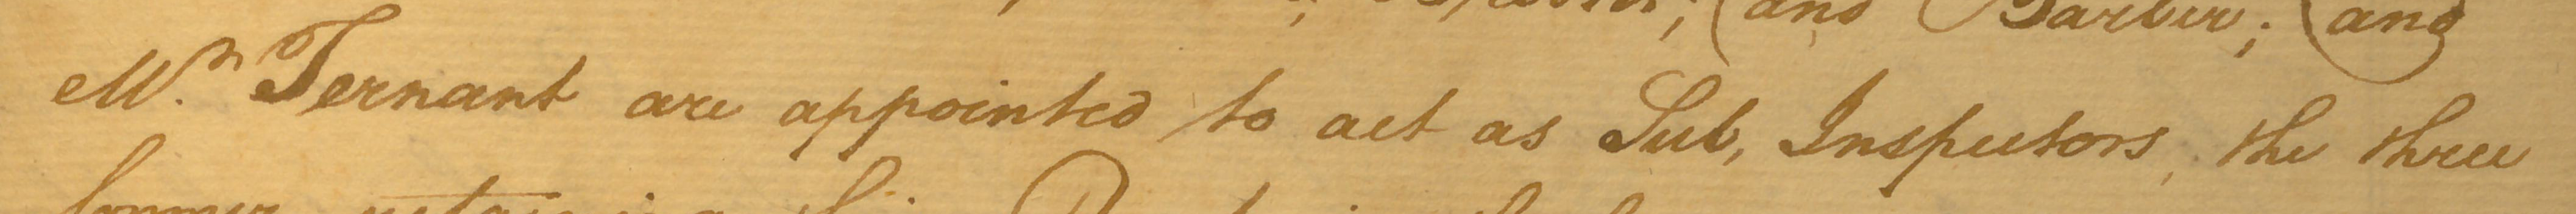M^r. Ternant are appointed to act as Sub, Inspectors the three
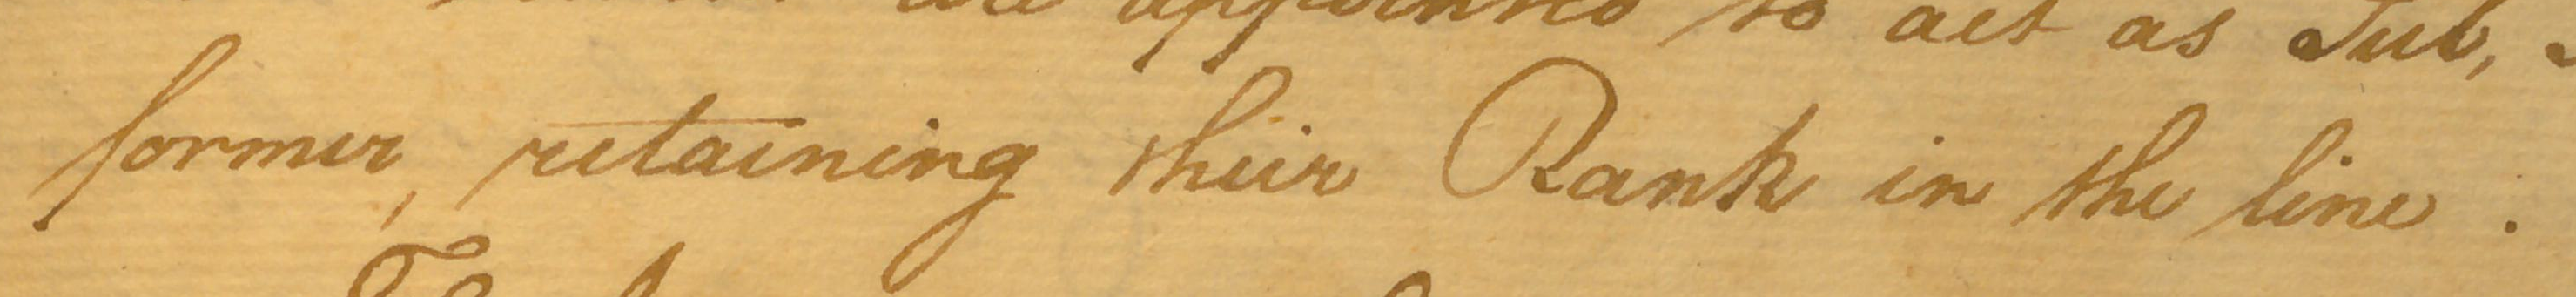former, retaining their Rank in the line.
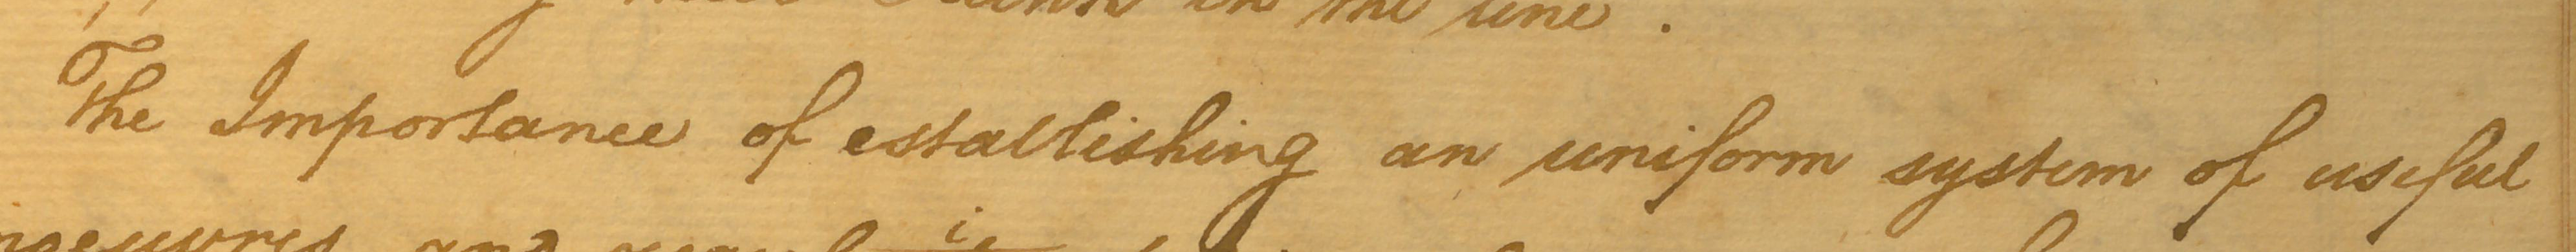The Importance of establishing an uniform system of useful
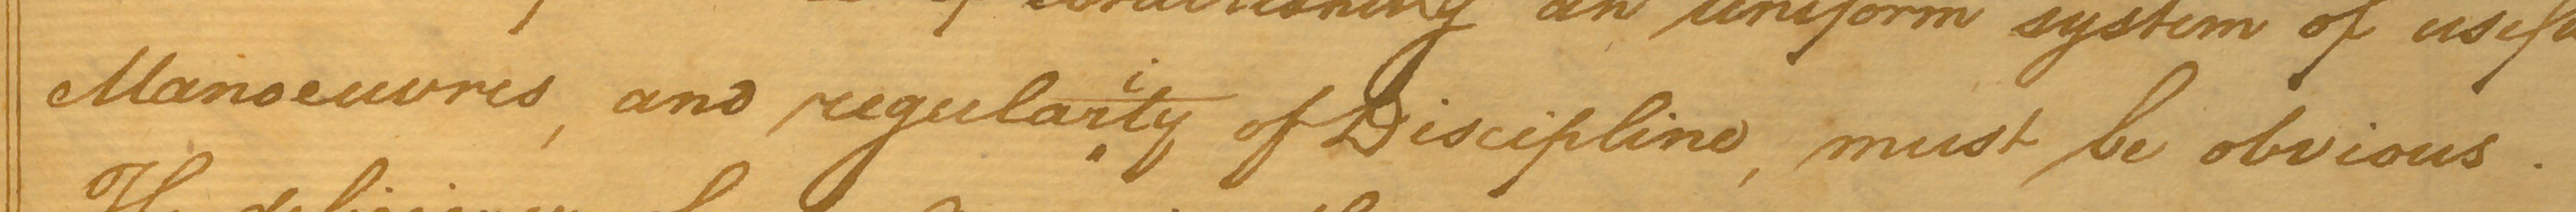Manoeuvres, and regular^ity of Discipline, must be obvious.
